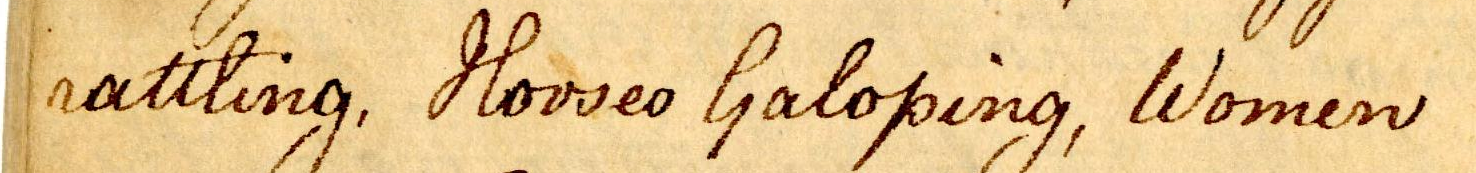rattling, Horses Galoping, Women
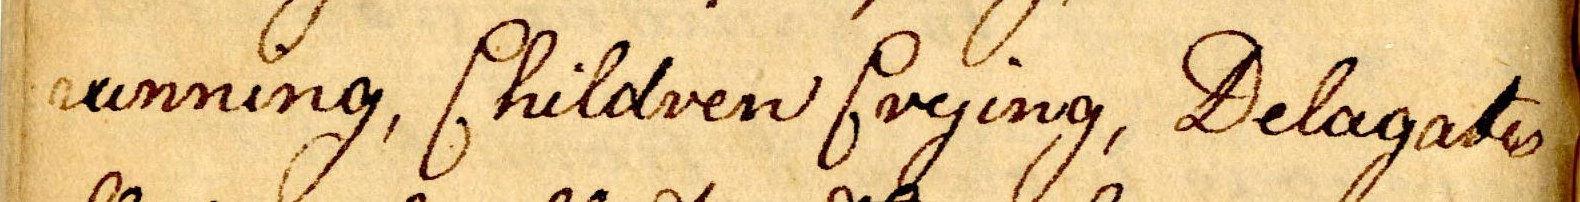running, Children Crying, Delagates
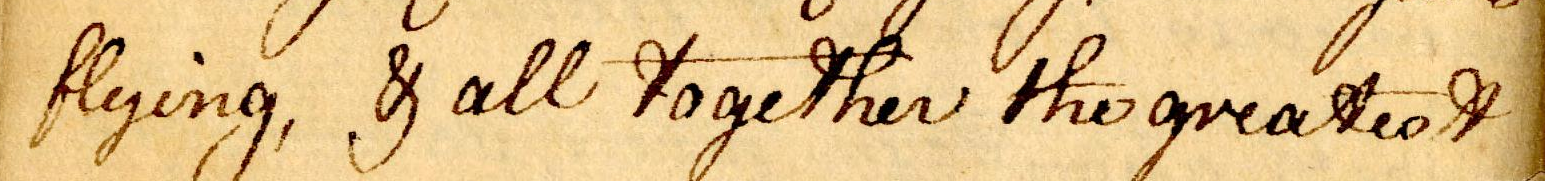flying, & all together the greatest
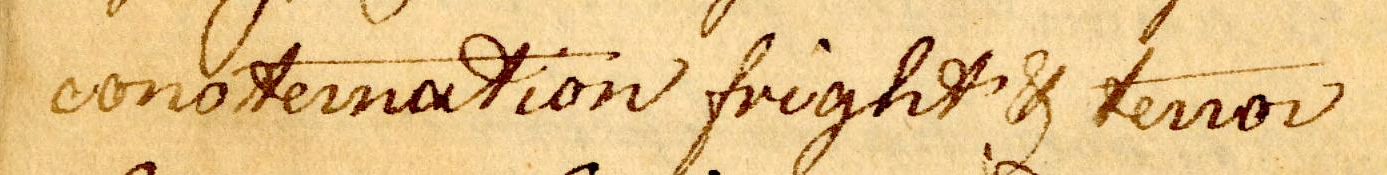consternation fright & terror
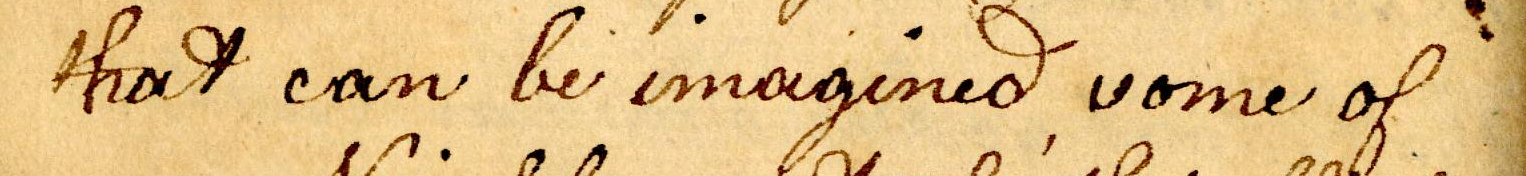that can be imagined, some of
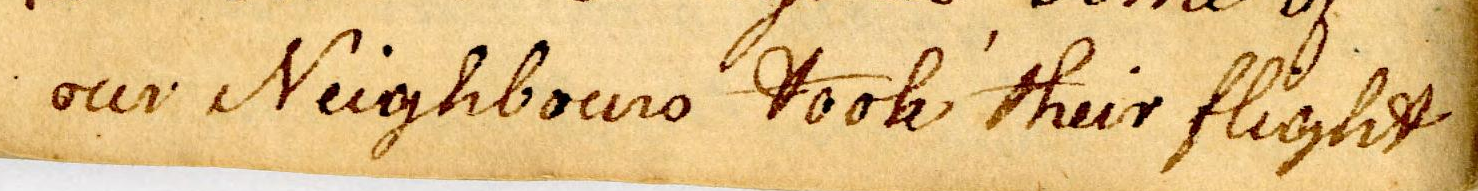our Neighbours took their flight
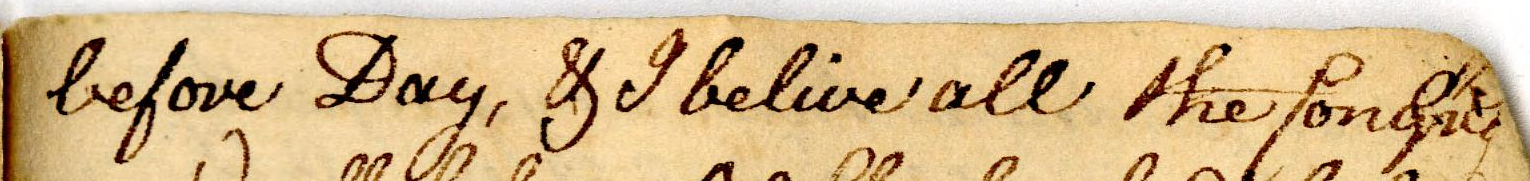before Day, & I belive all the Congres
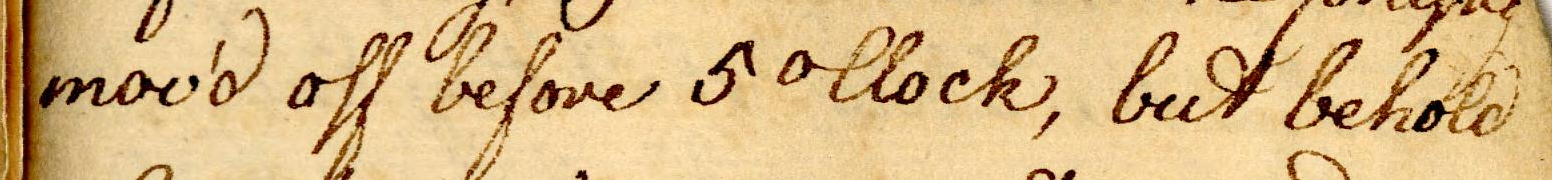mov'd off before 5 ^oClock, but behold
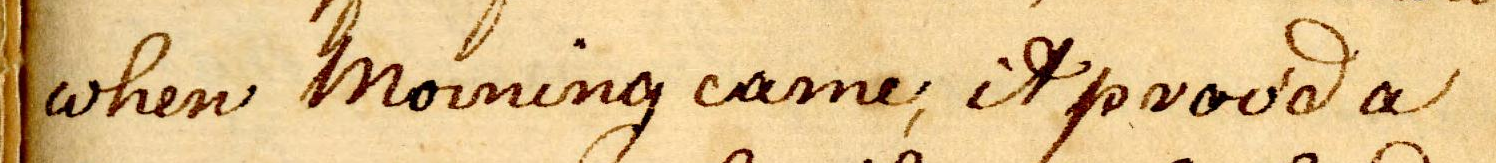when Morning came, it prov'd a
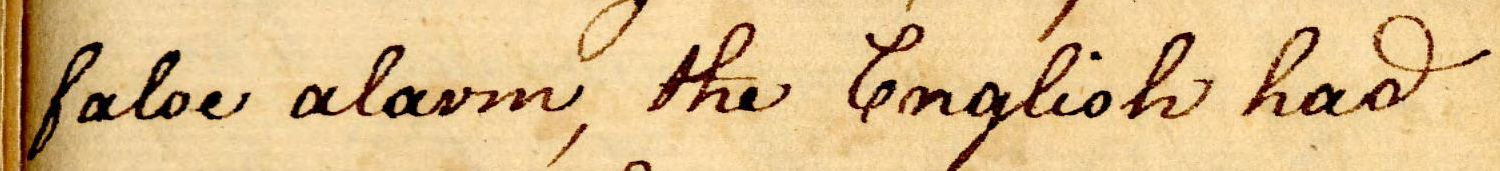false alarm, the English had
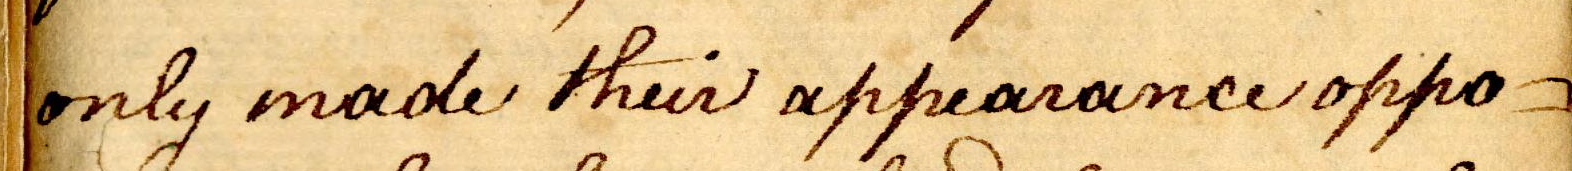only made their appearance oppo-
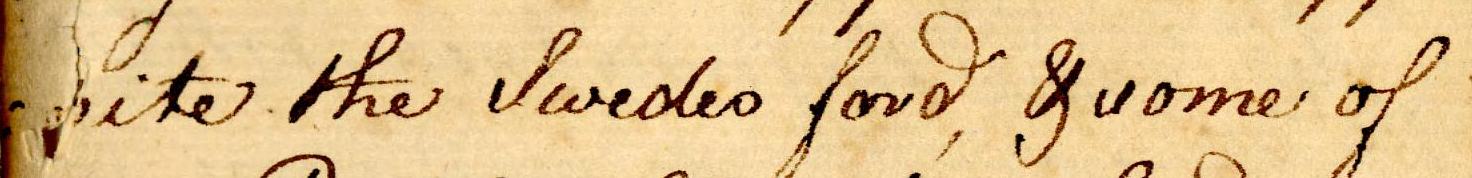-site the Swedes ford, & some of
